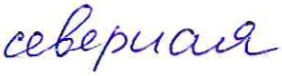северная
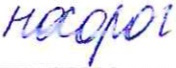носорог
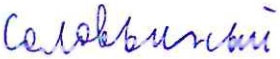соловьиный
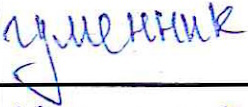гуменник
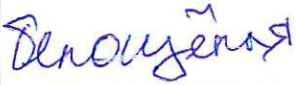белощёкая
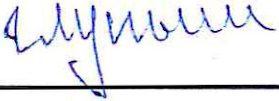глупыш
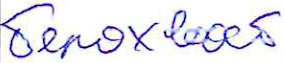белохвост
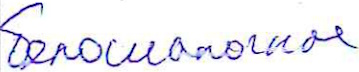белошапочная
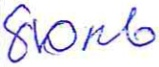бюль
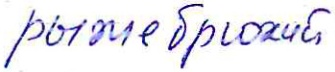рыжебрюхий
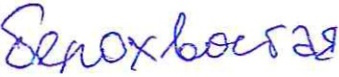белохвостая
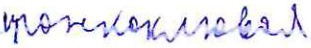тонкоклювая
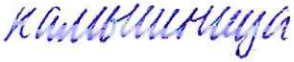камышница
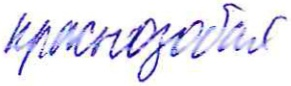краснозобая
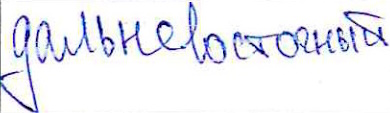дальневосточный
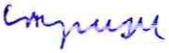стриж
